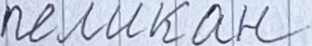пеликан
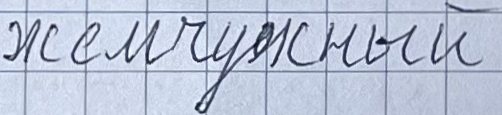жемчужный
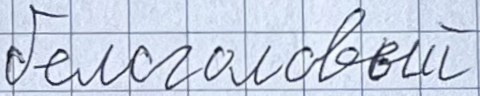белоголовый
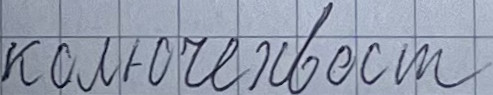колючехвост
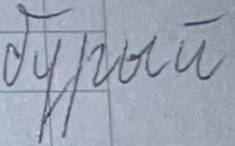бурый
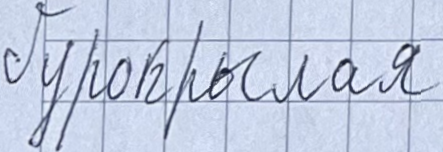бурокрылая
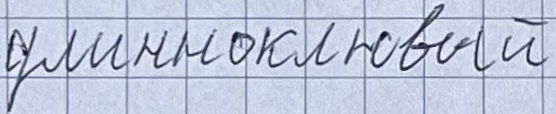длинноклювый
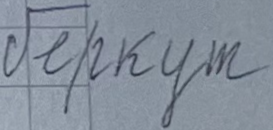беркут
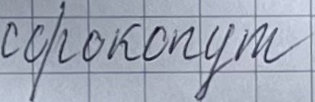сорокопут
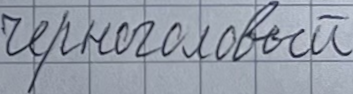черноголовый
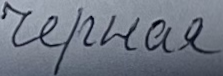черная
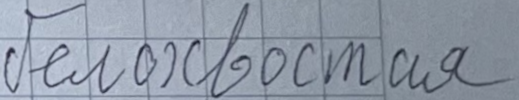белохвостая
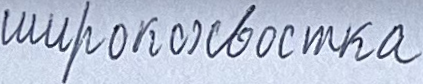широкохвостка
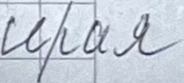серая
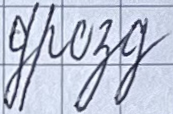дрозд
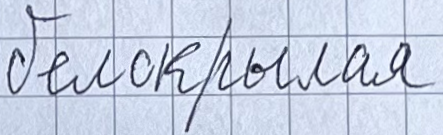белокрылая
